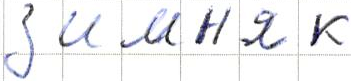зимняк
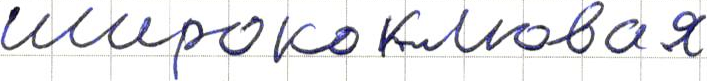ширококлювая
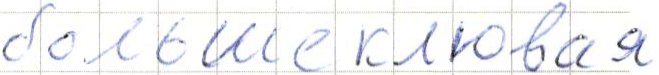большеклювая
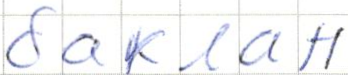баклан
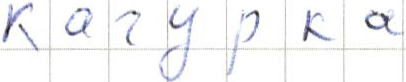качурка
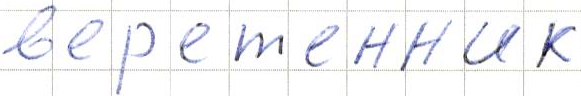веретенник
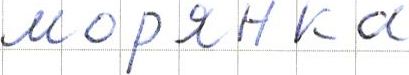морянка
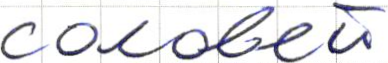соловей
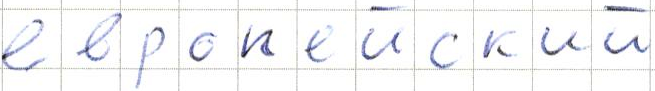европейский
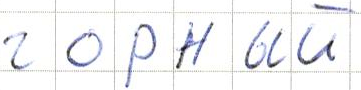горный
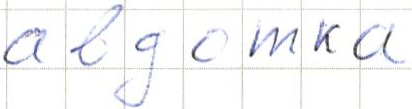авдотка
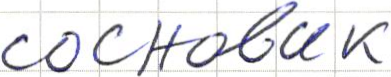сосновик
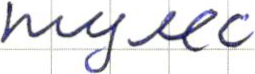тулес
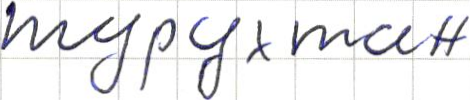турухтан
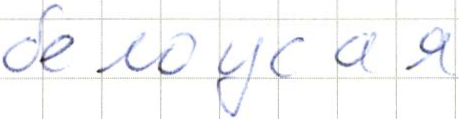белоусая
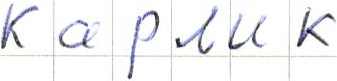карлик
